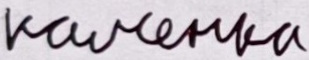каменка
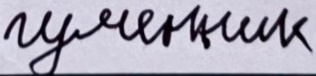гуменник
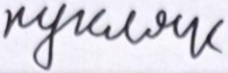пухляк
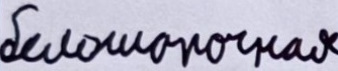белошапочная
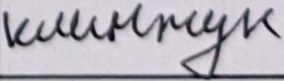клинтух
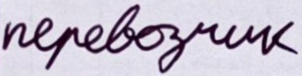перевозчик
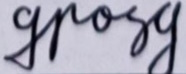дрозд
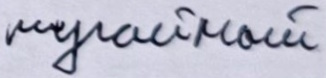тугайный
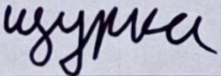щурка
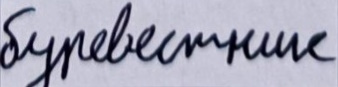буревестник
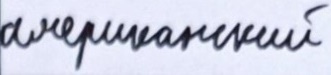американский
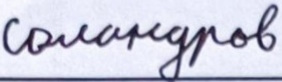соландров
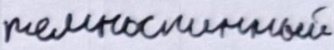темноспинный
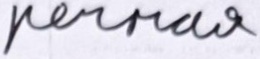речная
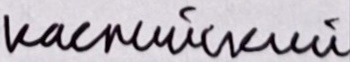каспийский
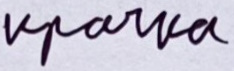крачка
